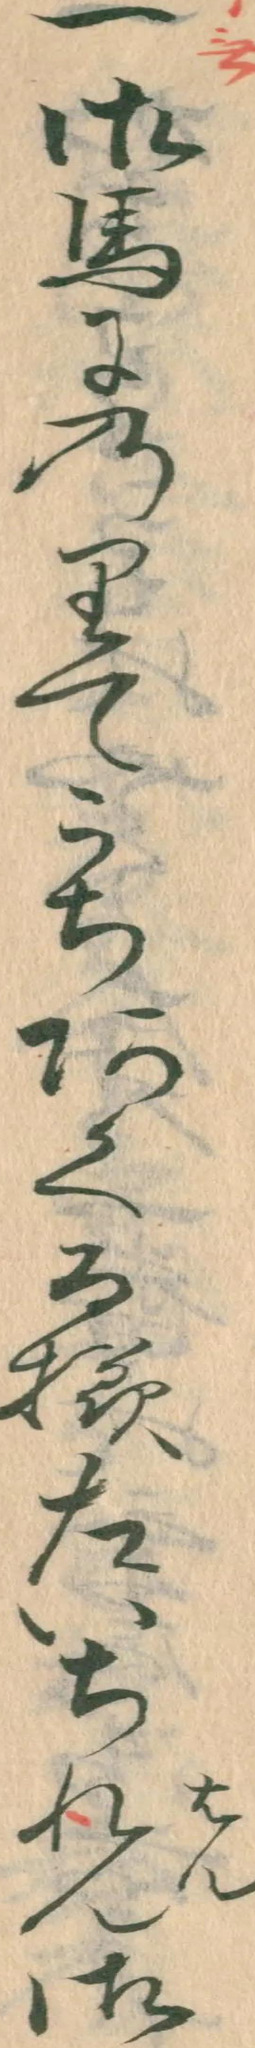一御馬にのりてうちあくる様左いちれん御
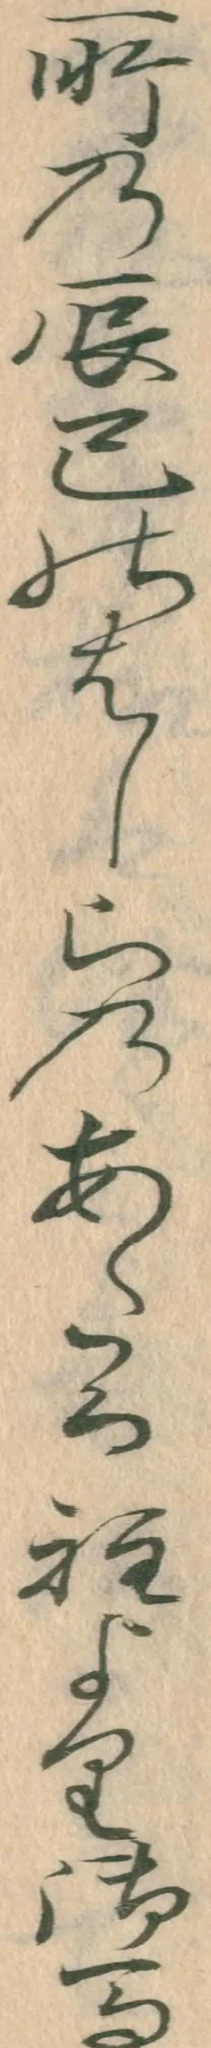所の辰巳のはしらのあたる程より御馬
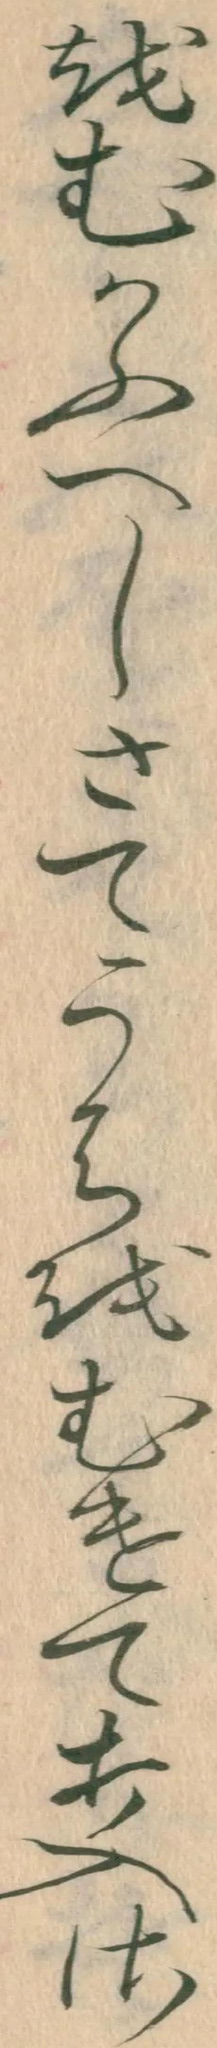をむかふへしさてうちをむけて打入さ
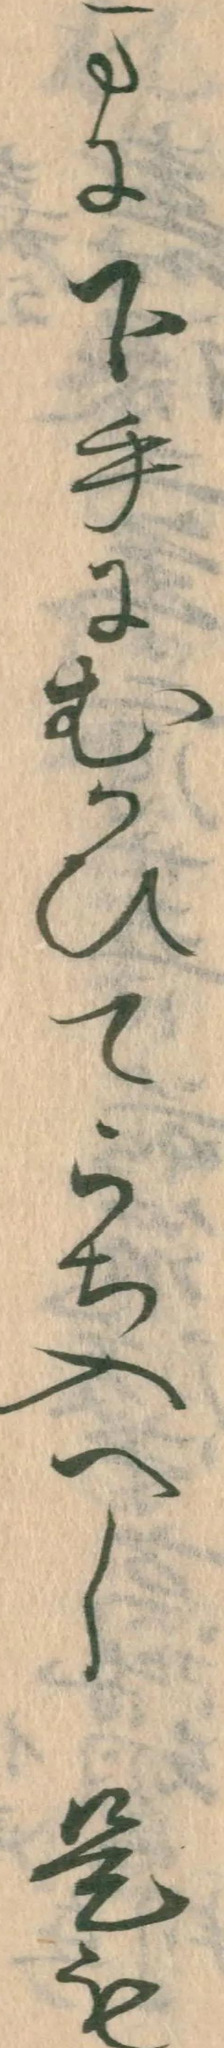まに下手にむかひてうち入へし是も
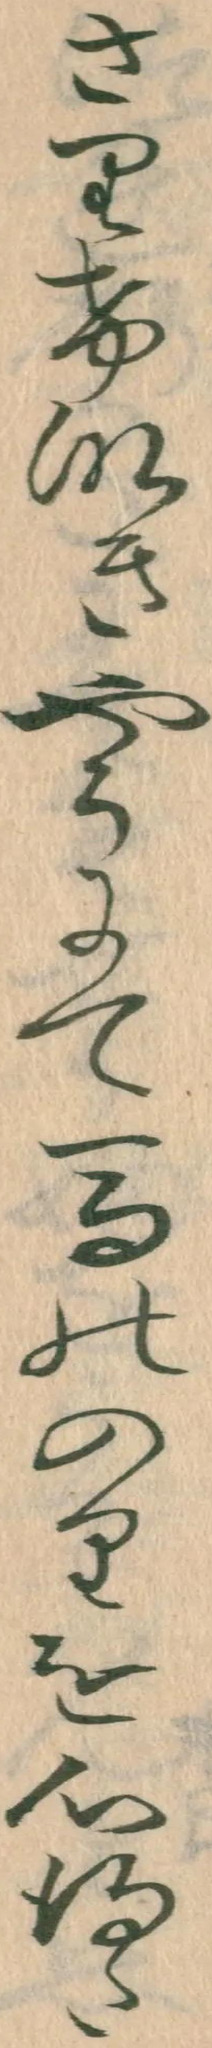さりけなきやうにて馬ののりを心得た
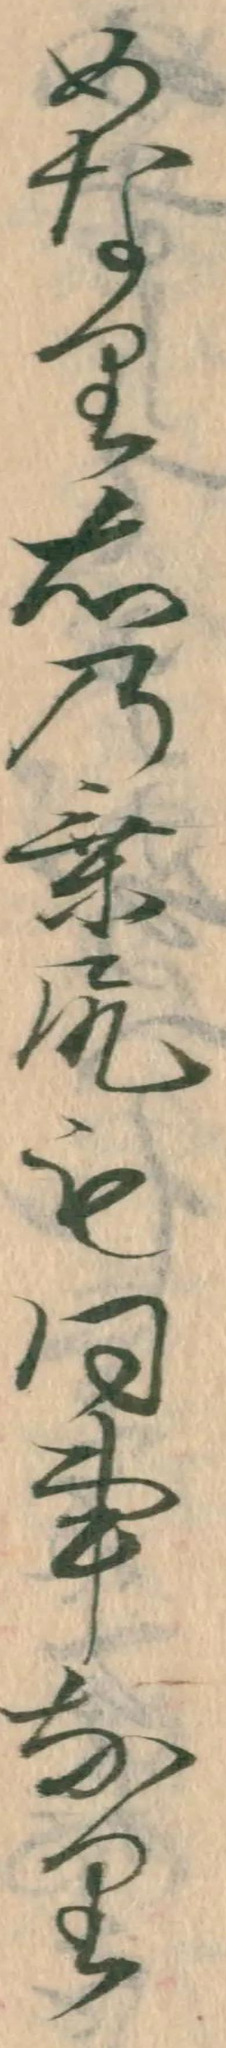めなり右の乗尻も同事なり
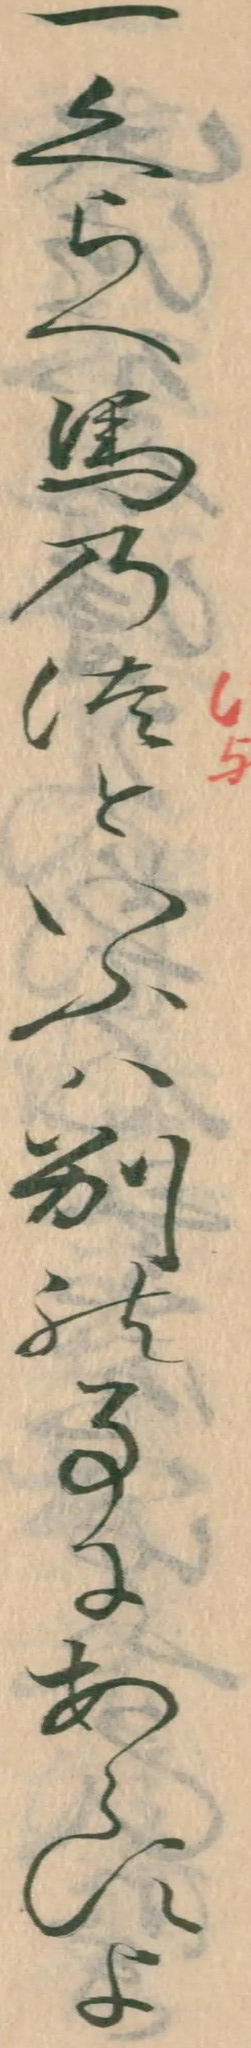一くらへ馬のつといふは別の事にあらすよ
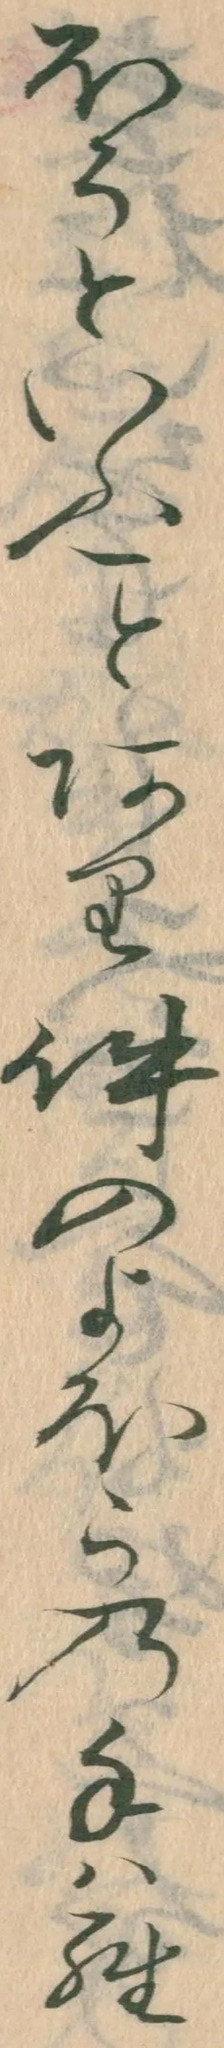ほうといふことあり件のよほうの手はら
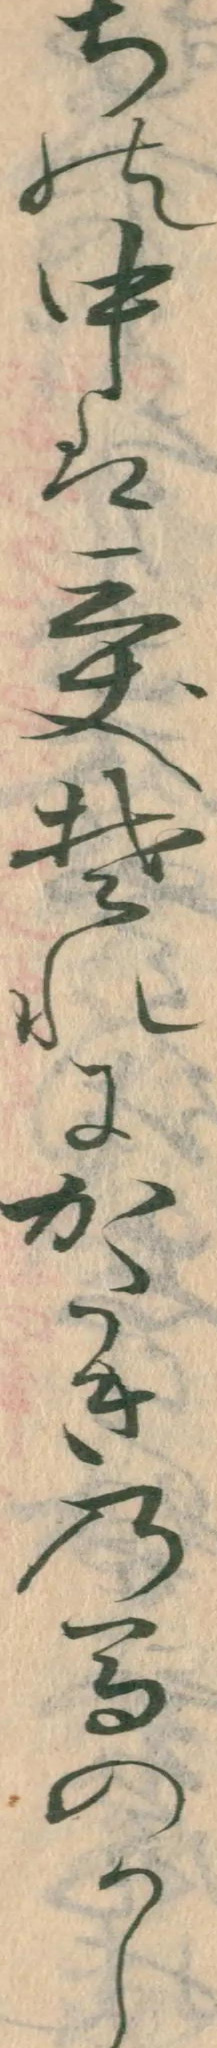ちの中は三丈それにかたきの馬のかし
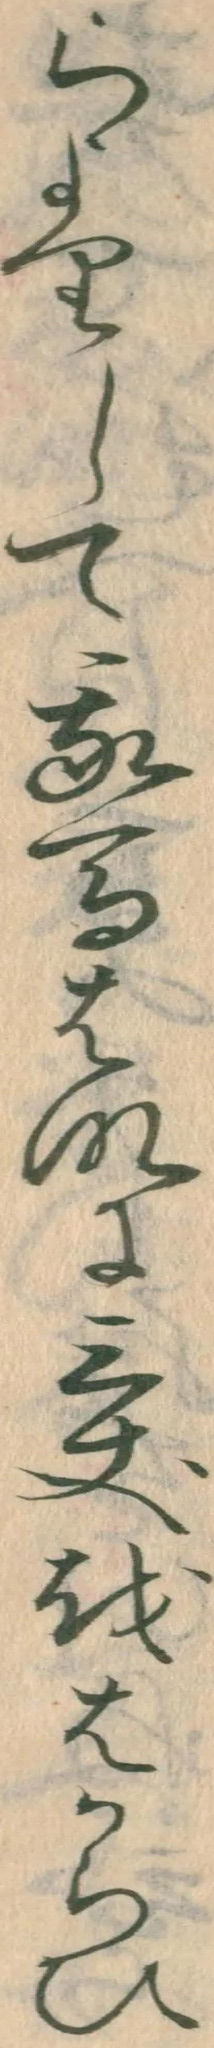らよりして我馬はなに三丈をはからひ
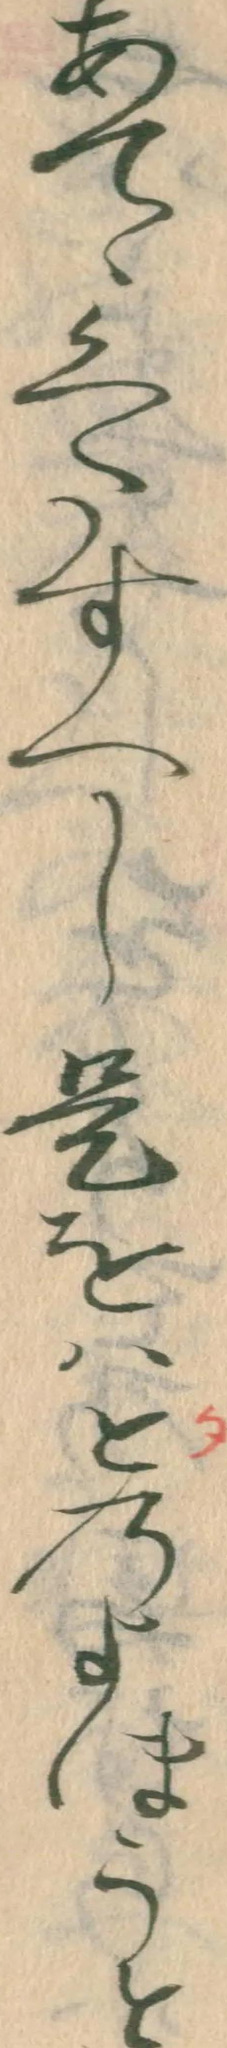あてゝくたすへし是をはとのよほうと
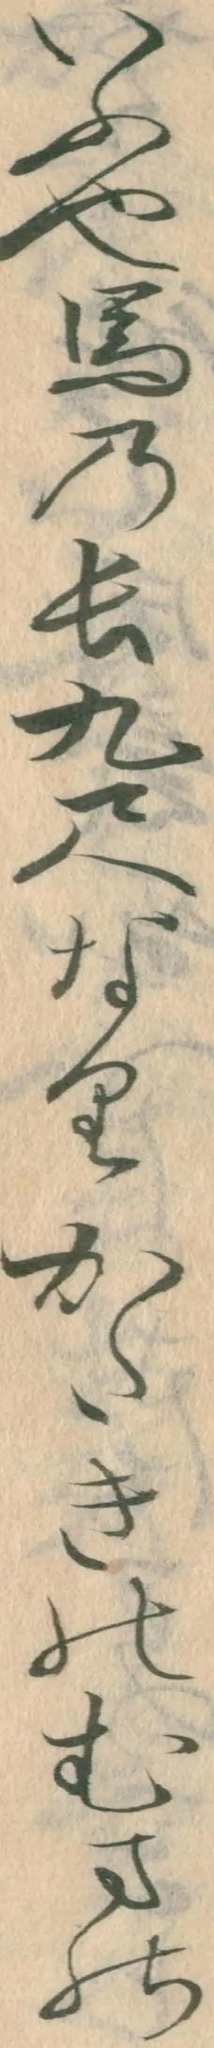いふ也馬の長九尺なりかたきのむまの
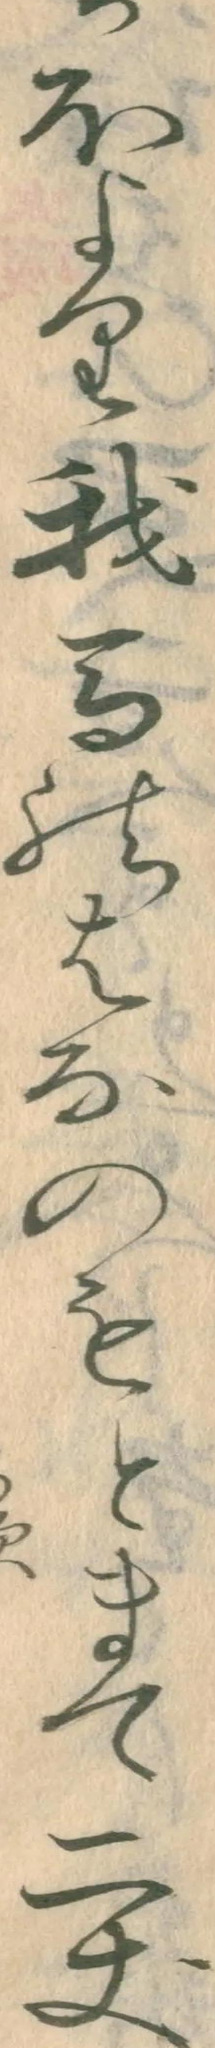かほより我馬のはなのもとまて二丈
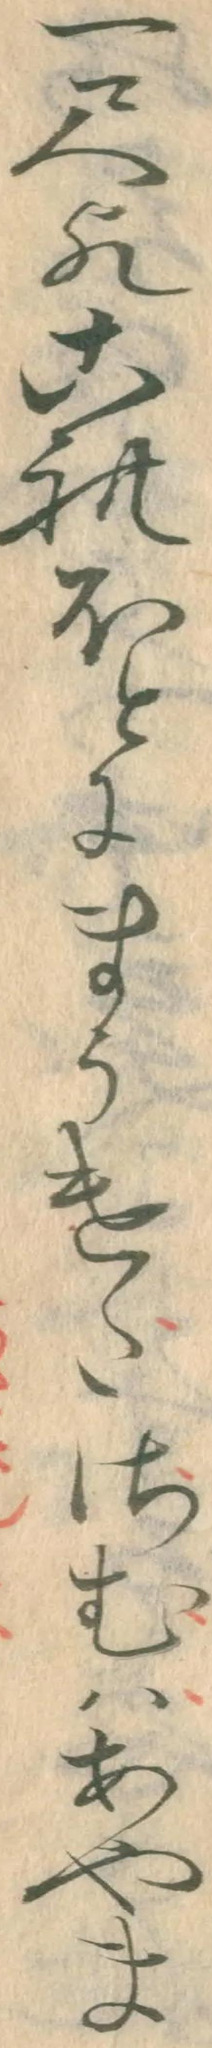一尺歟これほとにまうけ「たさむは」あやま
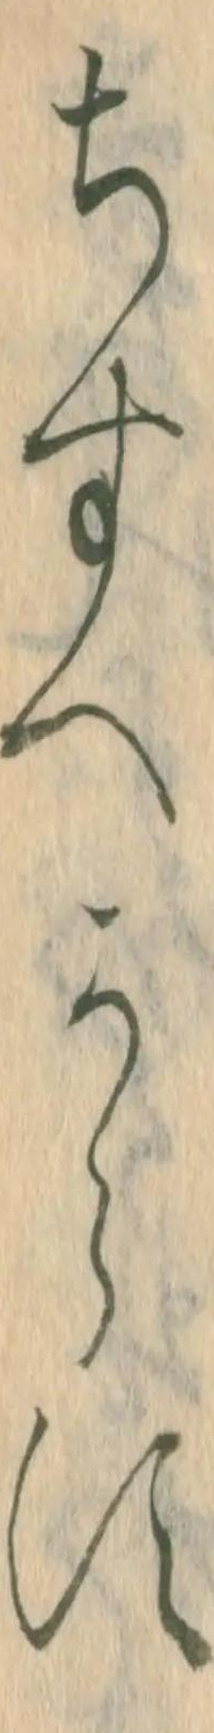ちすへからす

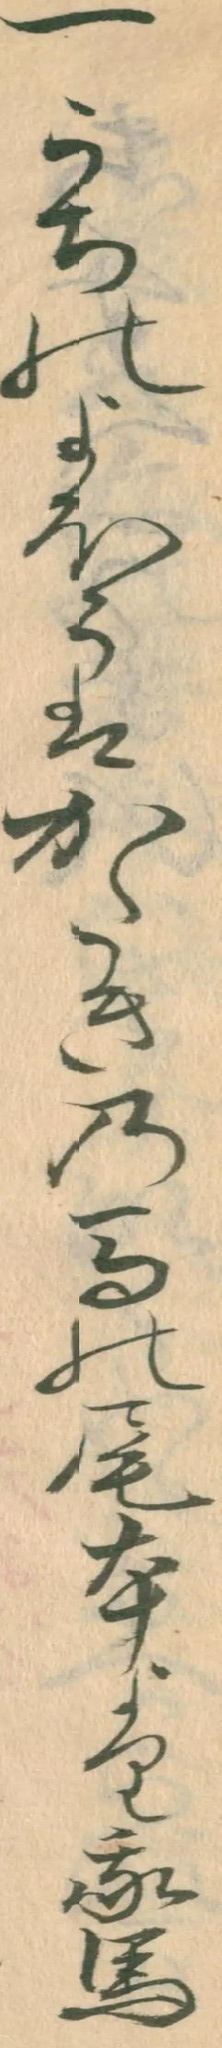一うちのよほうはかたきの馬の尾本より我馬
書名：賀茂社記録. 第13冊
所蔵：国立国会図書館 National Diet Library, JAPAN
